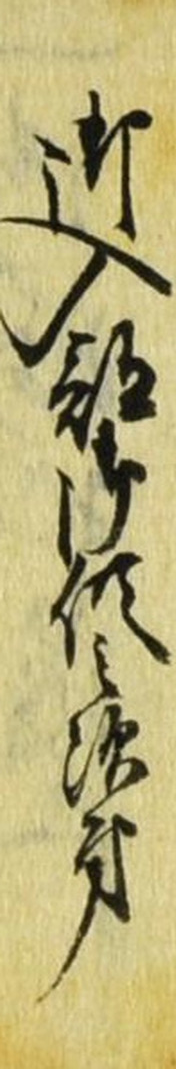御入部御供之次第
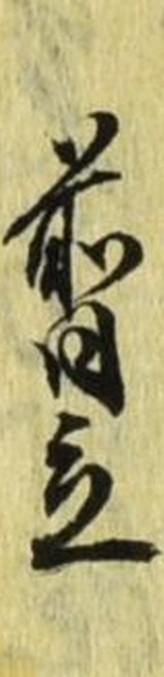前日立
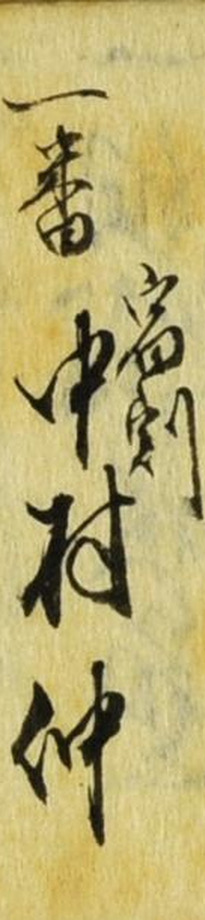一番中村伸
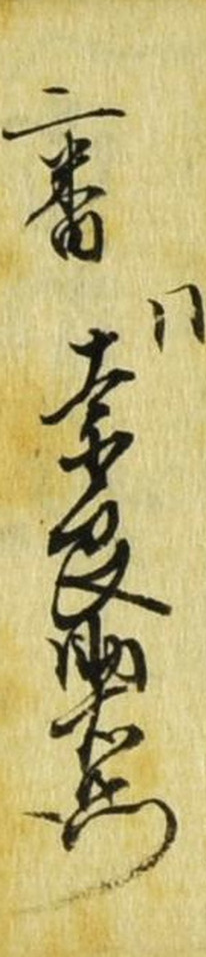二番奈良助右衛門
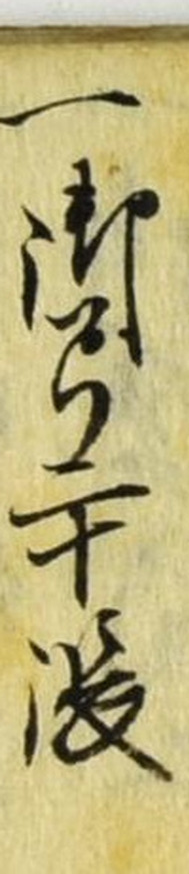一御弓二十張
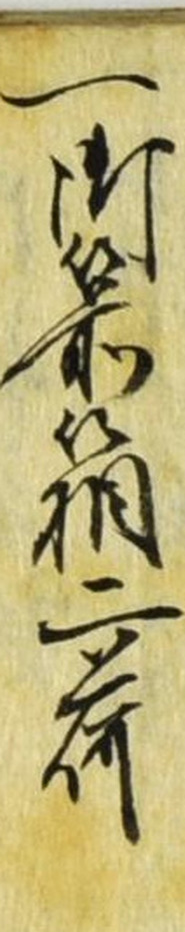一御箭箱二荷
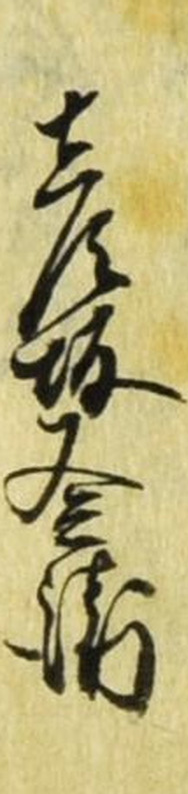彦坂又兵衛
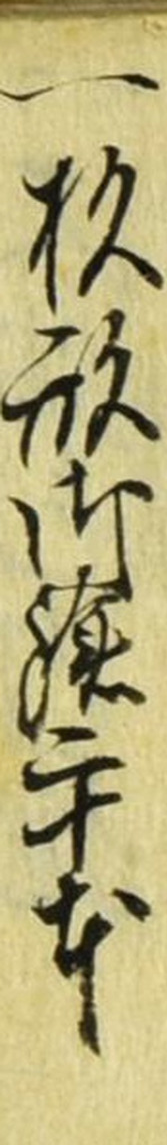一杉形御鎗二十本
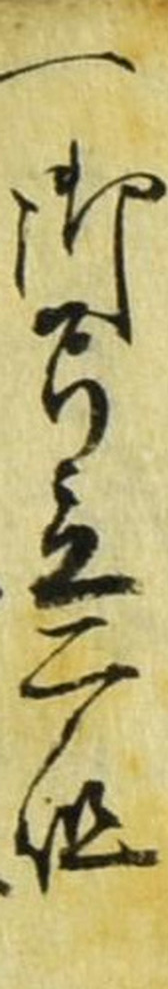一御弓立二組
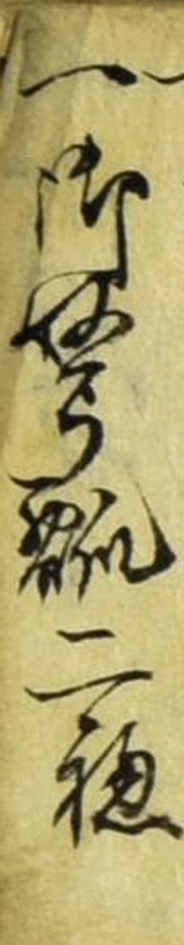一御弩瓢二穂
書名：天保九戊戌年御入部御道中御供行列帳
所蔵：福井県立図書館
